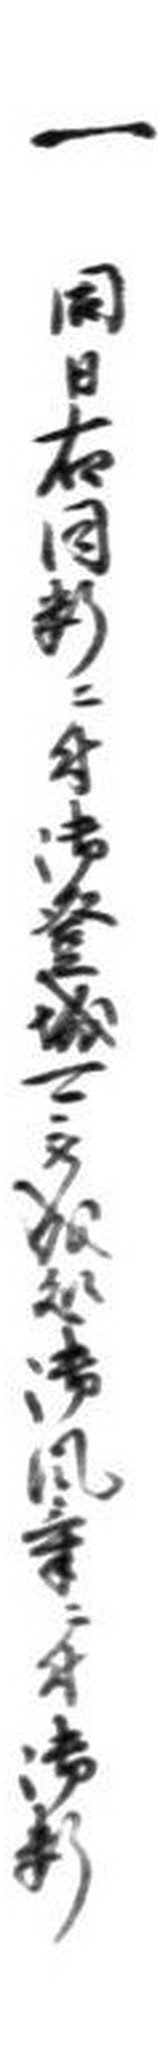一同日右同断ニ付御登城可被成処御風気ニ付御断
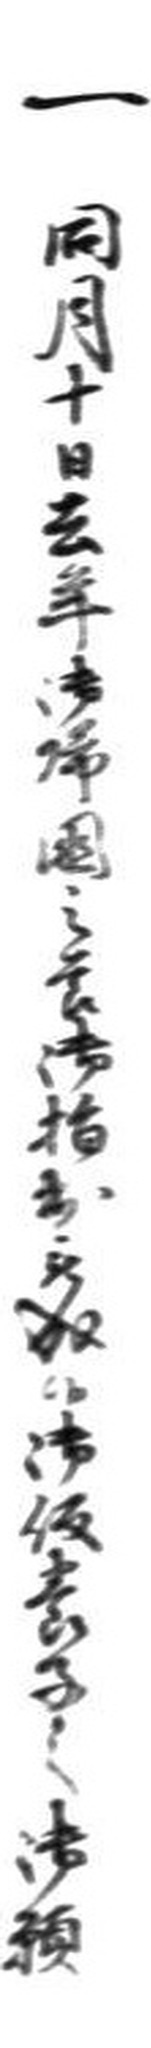一同月十日去年御帰国之節御指出被成候御仮養子之御願
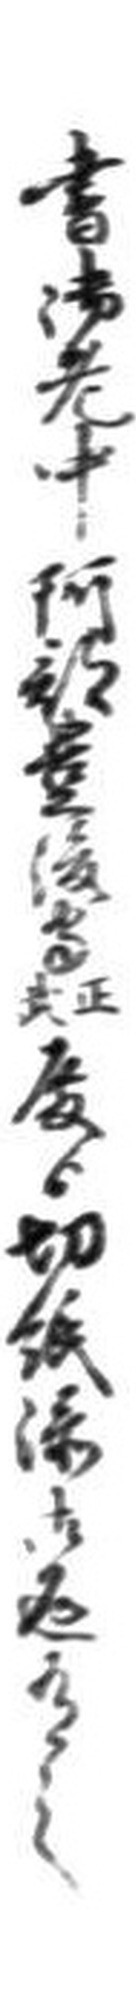書御老中阿部豊後守正武殿ゟ切紙添御返有之
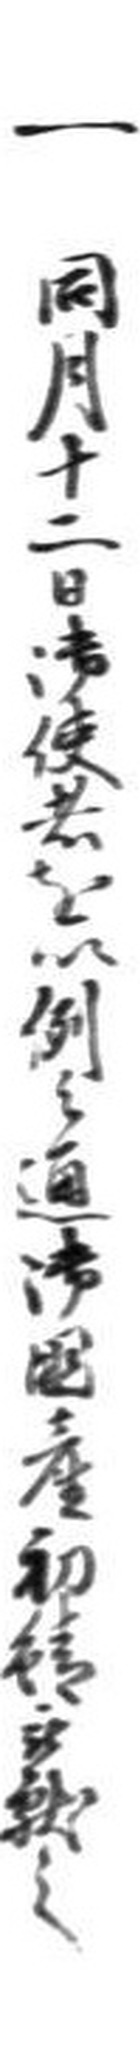一同月十二日御使者を以例之通御国産初鯖被献之

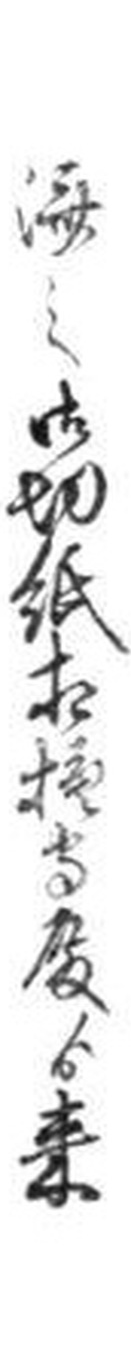済之御切紙相模守殿ゟ来
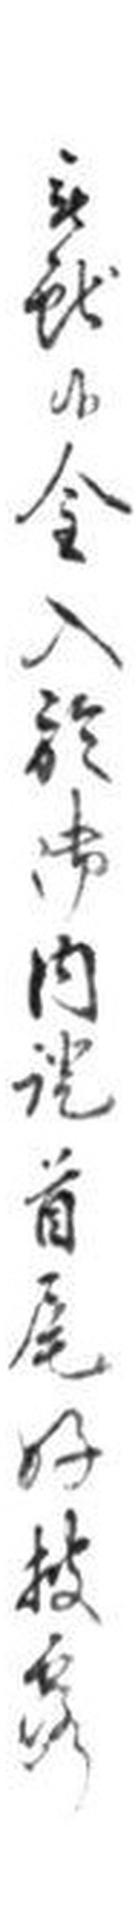被献候金入於御内證首尾好披露
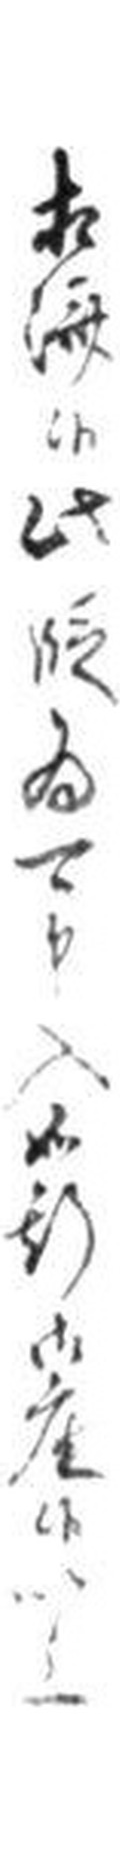相済候此段為可申入如斯御座候以上
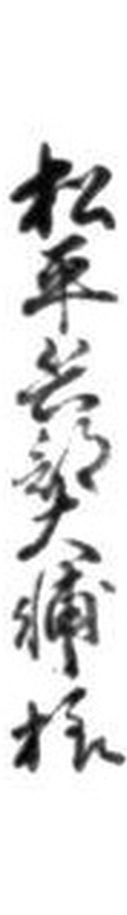松平兵部大輔様
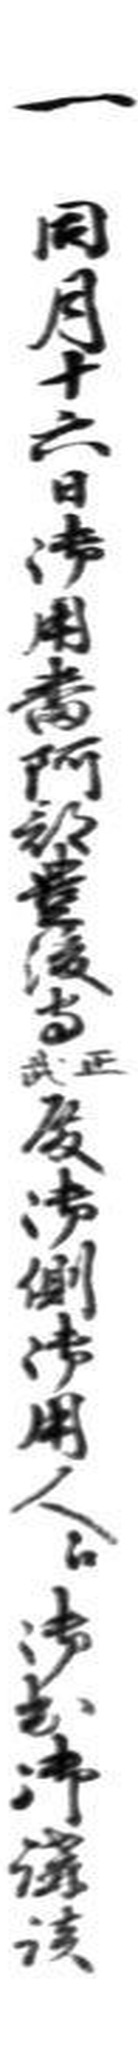一同月十六日御用番阿部豊後守正武殿御側御用人江御出御講談
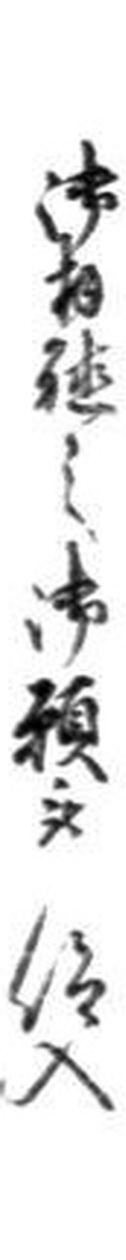御拝聴之御願被仰入
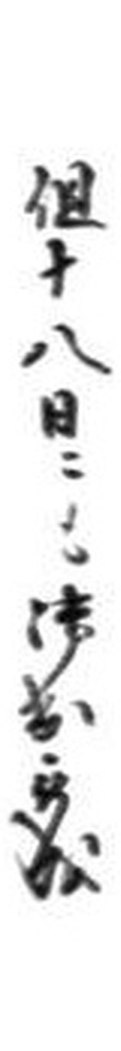但十八日ニも御出被成
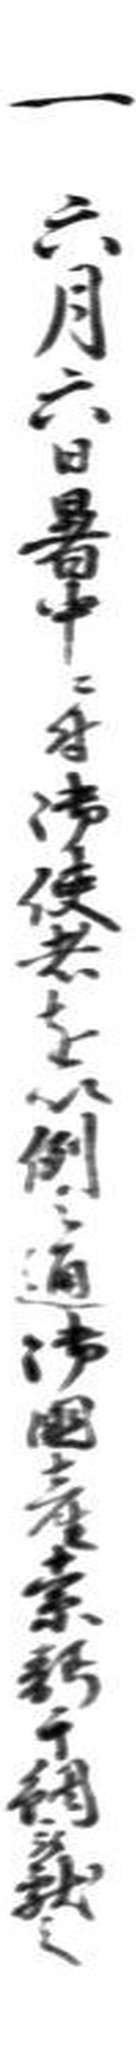一六月六日暑中ニ付御使者を以例之通御国産素麵干鯛被献之
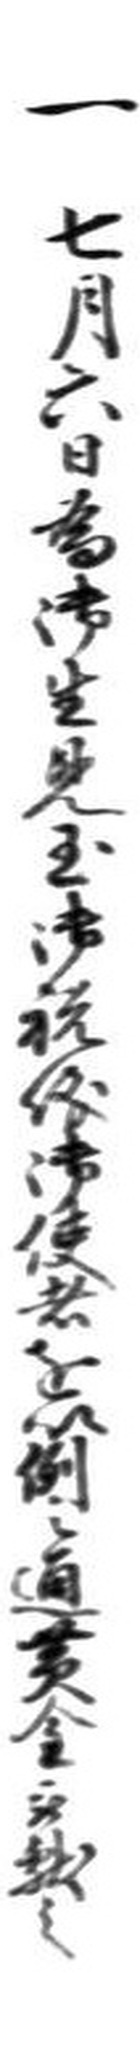一七月六日為御生見玉御祝儀御使者を以例之通黄金被献之
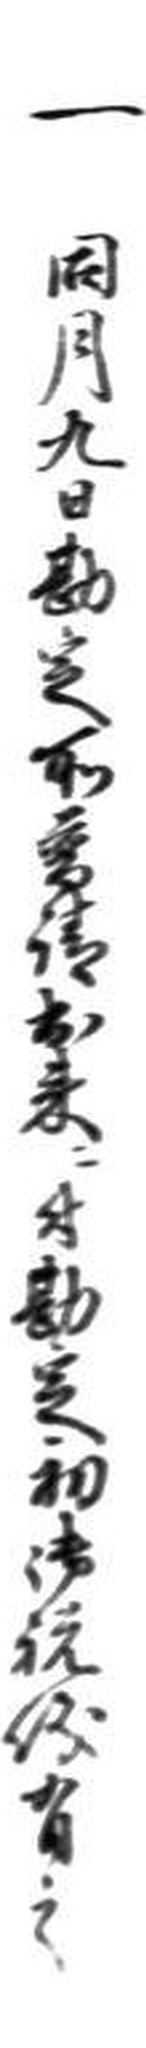一同月九日勘定所普請出来ニ付勘定初御祝儀有之
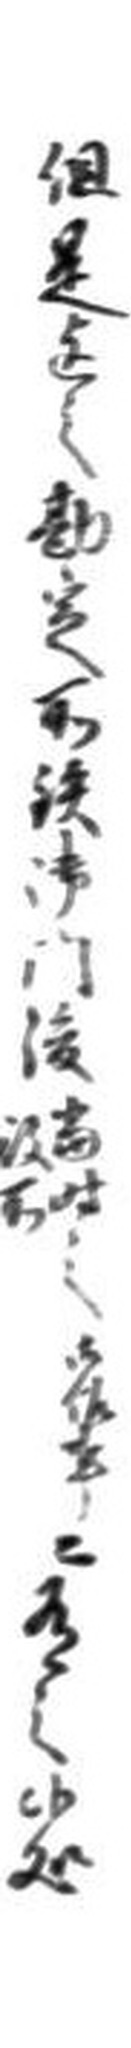但是迄之勘定所鉄御門後当時之御作事役所ニ有之候処
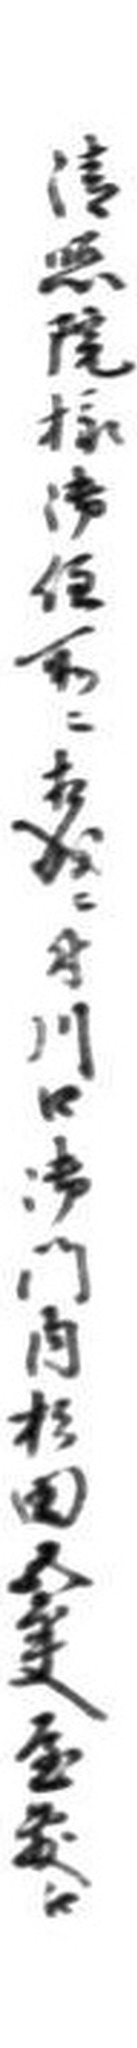清照院様御住所ニ相成ニ付川口御門内杉田五太夫屋敷江
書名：家譜 二十一 吉品公 従元禄十三年到同十四年
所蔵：福井県文書館 Fukui Prefectural Archives
